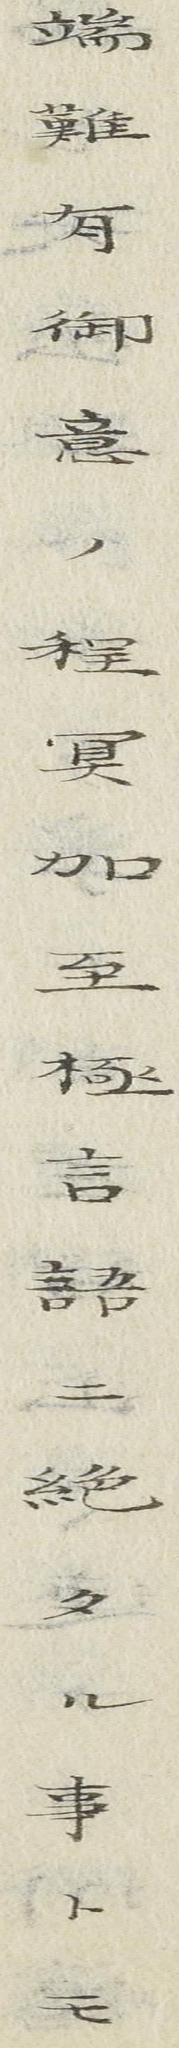端難有御意ノ程冥加至極言語ニ絶タル事トモ
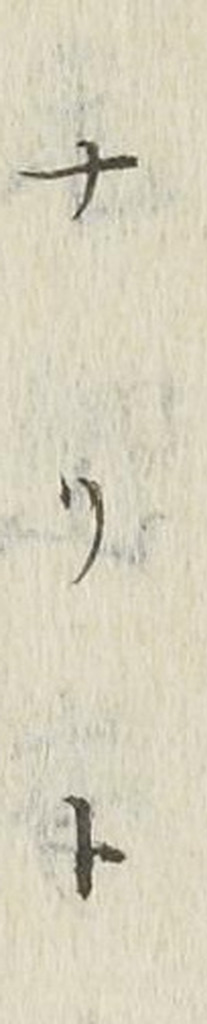ナリト
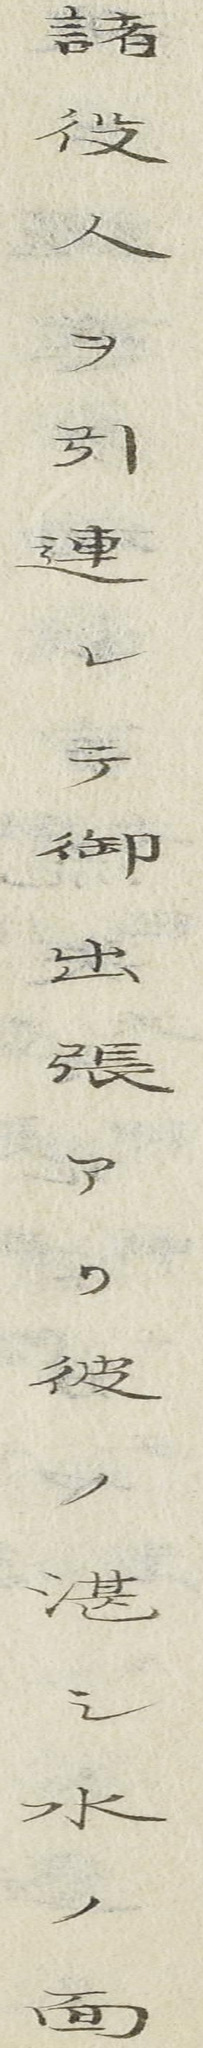諸役人ヲ引連レテ御出張アリ彼ノ湛シ水ノ面
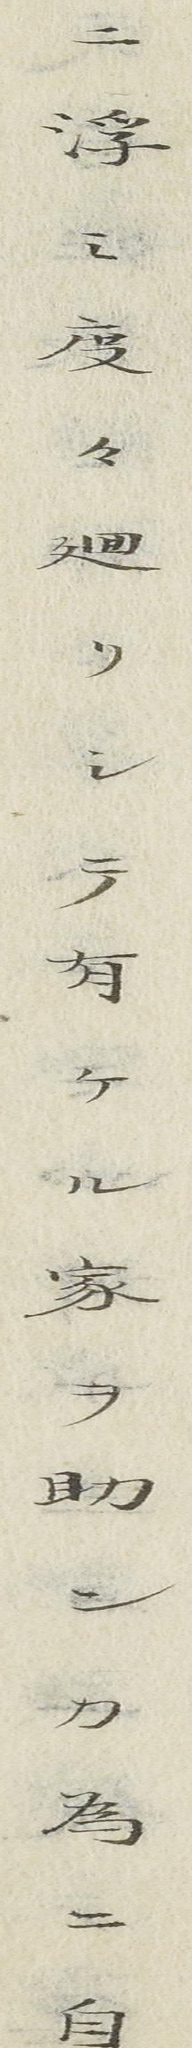ニ浮ミ度々廻リシテ有ケル家ヲ助ンカ為ニ自
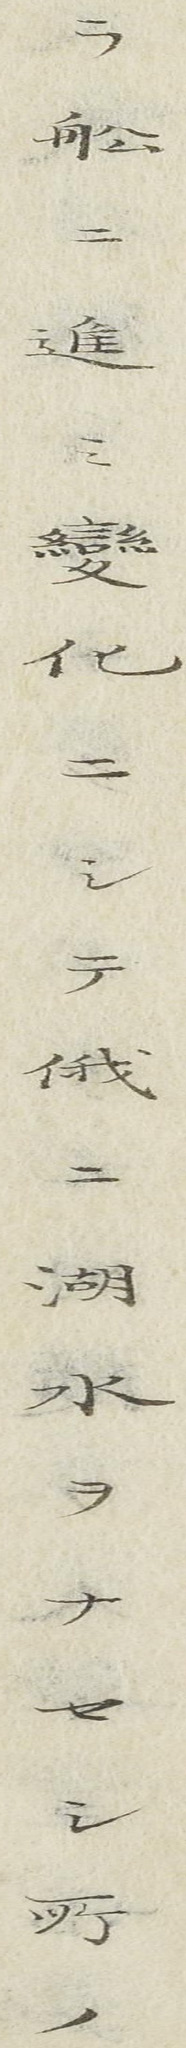ラ船ニ進ミ変化ニシテ俄ニ湖水ヲナセシ所ノ
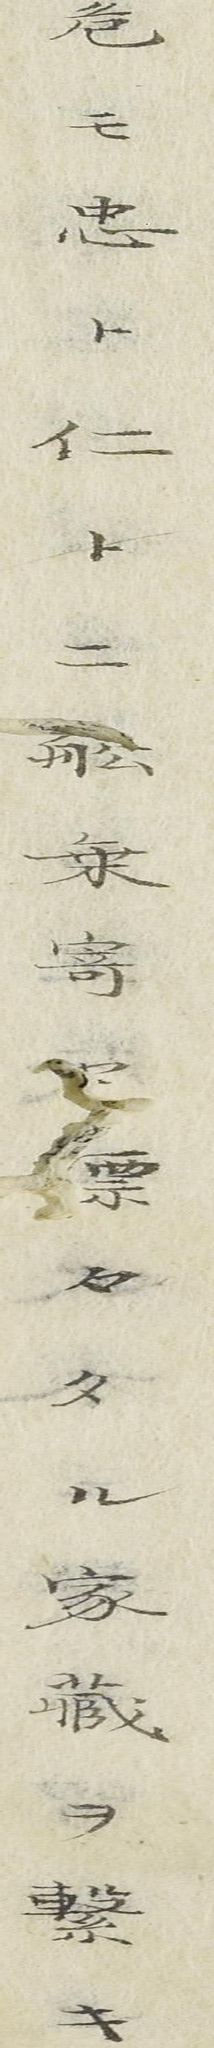危モ忠ト仁トニ船乗寄セ漂々タル家蔵ヲ繋キ

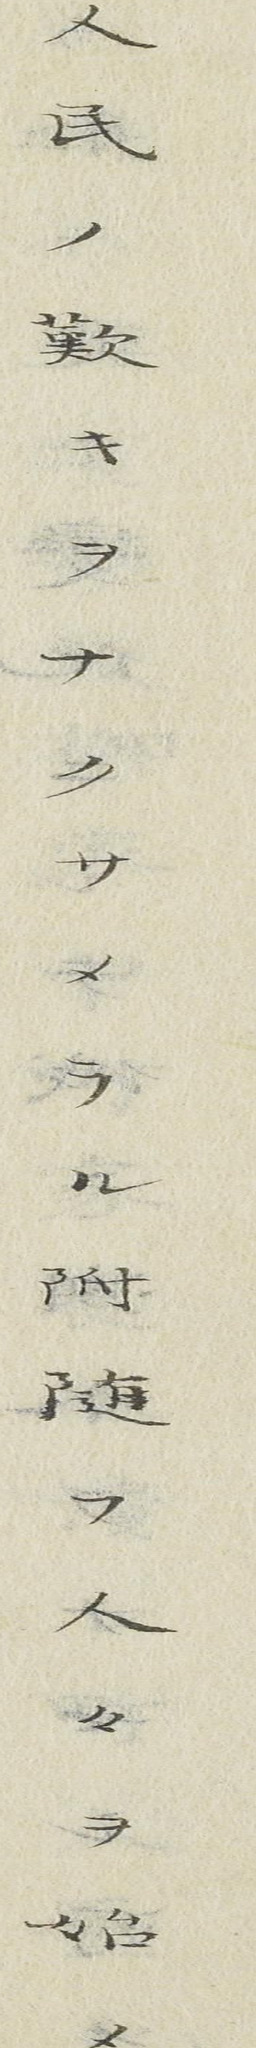人民ノ歎キヲナクサメラル附随フ人々ヲ始メ
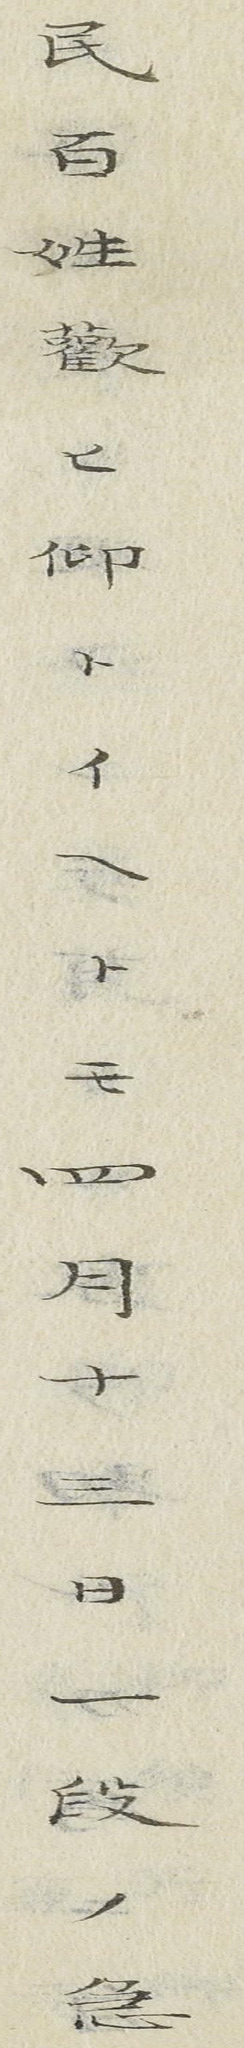民百姓歎ヒ仰トイヘトモ四月十三日一段ノ急
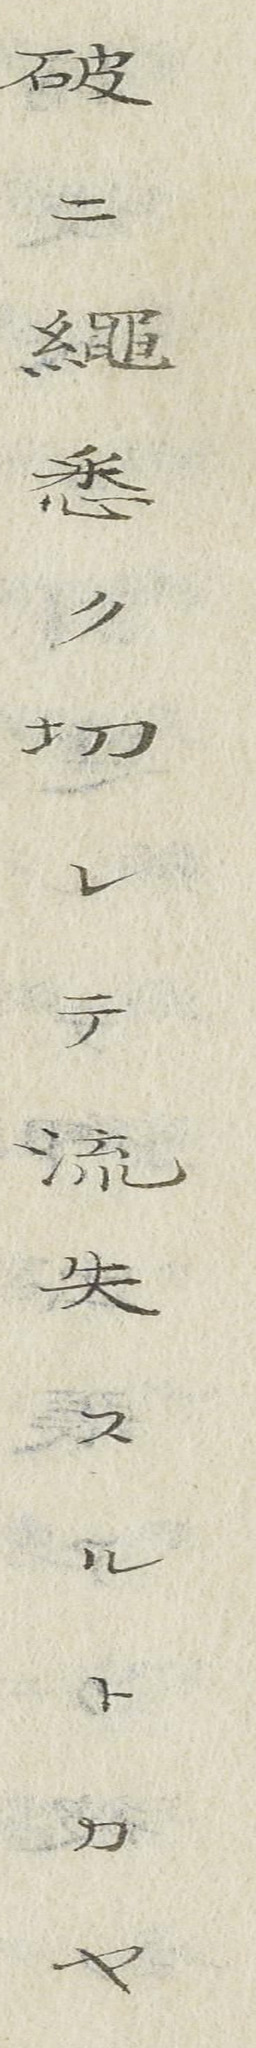破ニ縄悉ク切レテ流失スルトカヤ
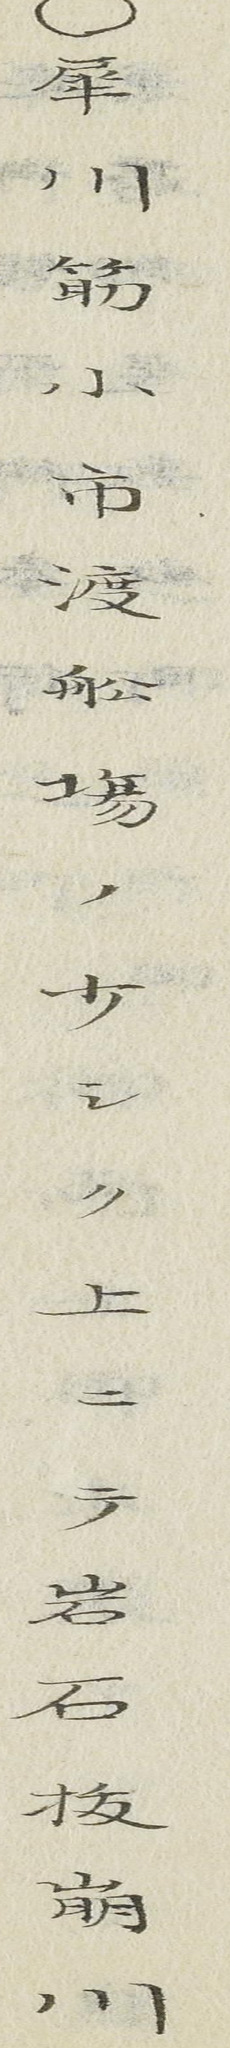〇犀川筋小市渡船場ノ少シク上ニテ岩石抜崩川
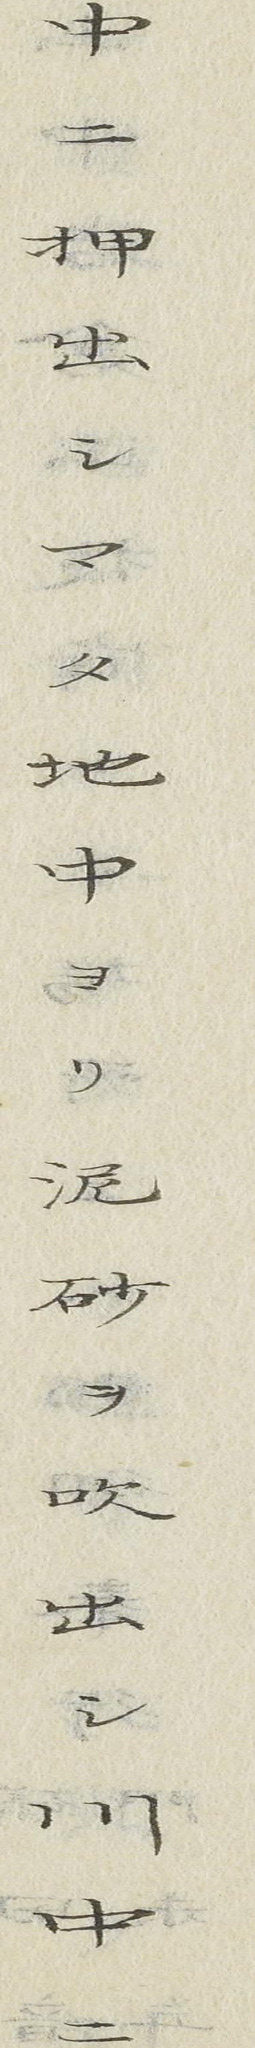中ニ押出シマタ地中ヨリ泥砂ヲ吹出シ川中ニ
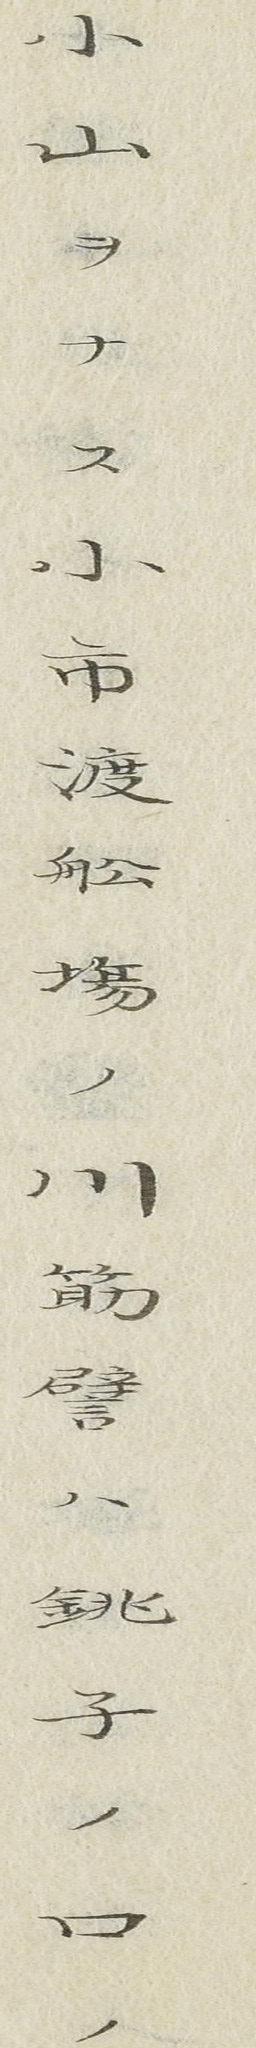小山ヲナス小市渡船場ノ川筋譬ハ銚子ノ口ノ
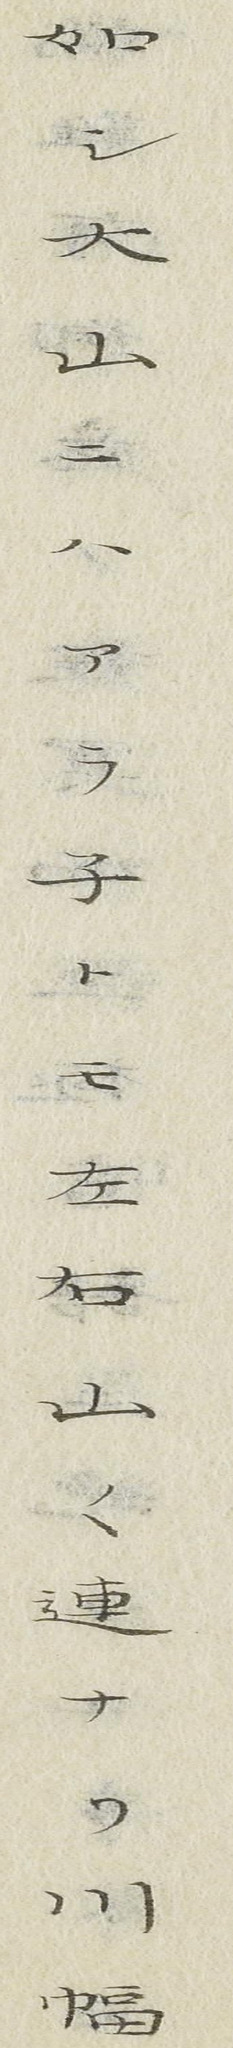如シ大山ニハアラ子トモ左右山〱連ナリ川幅
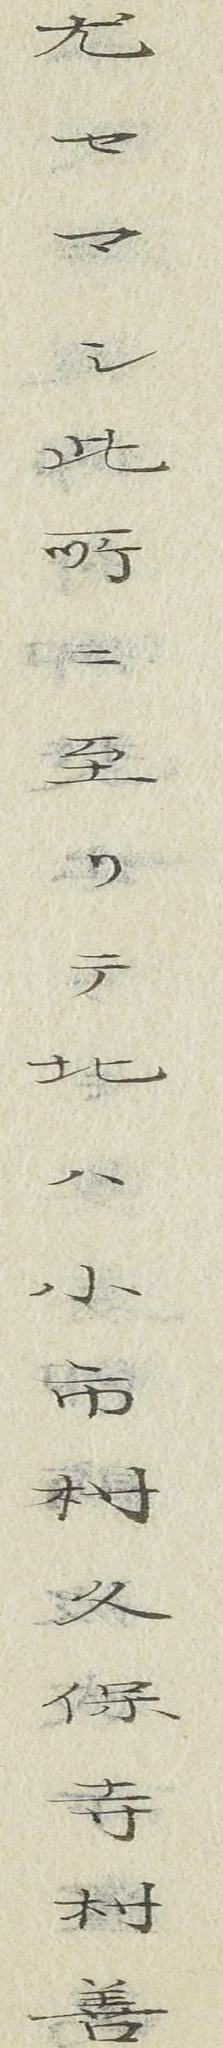尤セマシ此所ニ至リテ北ハ小市村久保寺村善
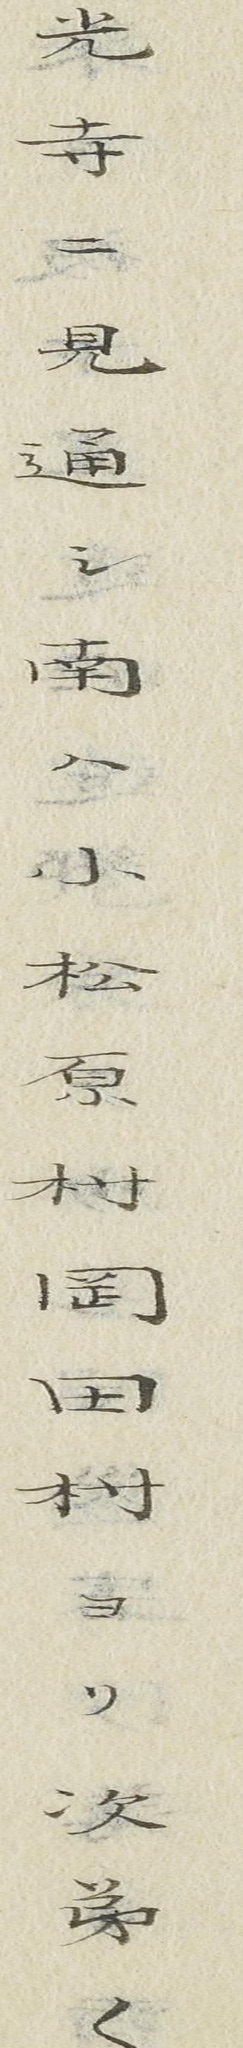光寺ニ見通シ南ハ小松原村岡田村ヨリ次第〱
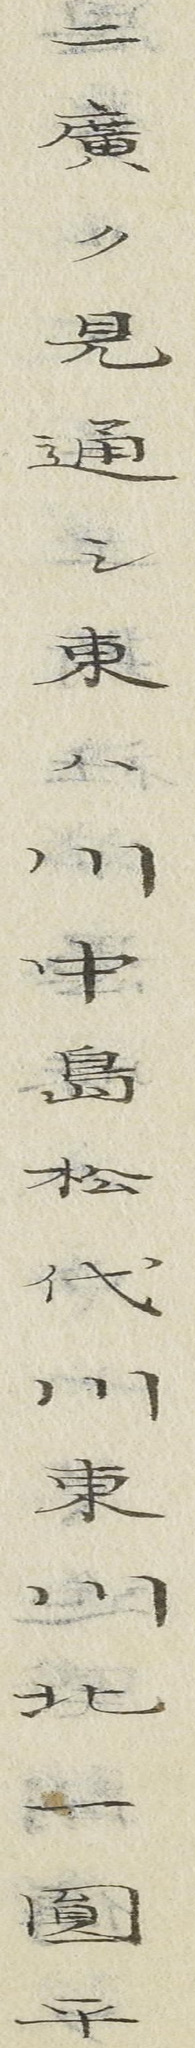ニ広ク見通シ東ハ川中島松代川東川北一円平
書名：地災撮要　地震之部　巻ノ二
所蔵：東京大学地震研究所図書室 Earthquake Research Institute Library, The University of Tokyo, JAPAN
